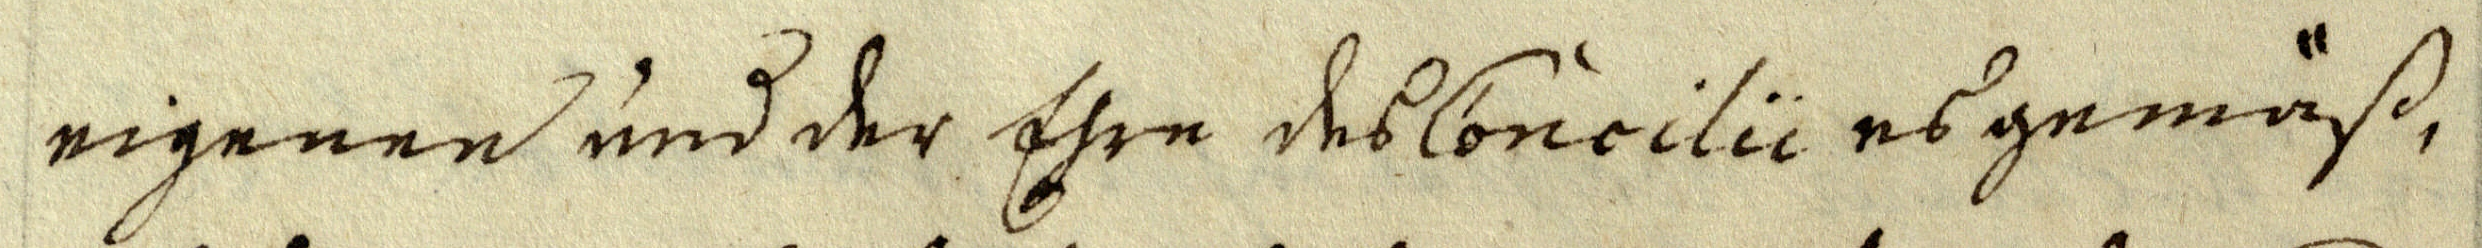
eigenen und der Ehre des Concilii er gemäß,
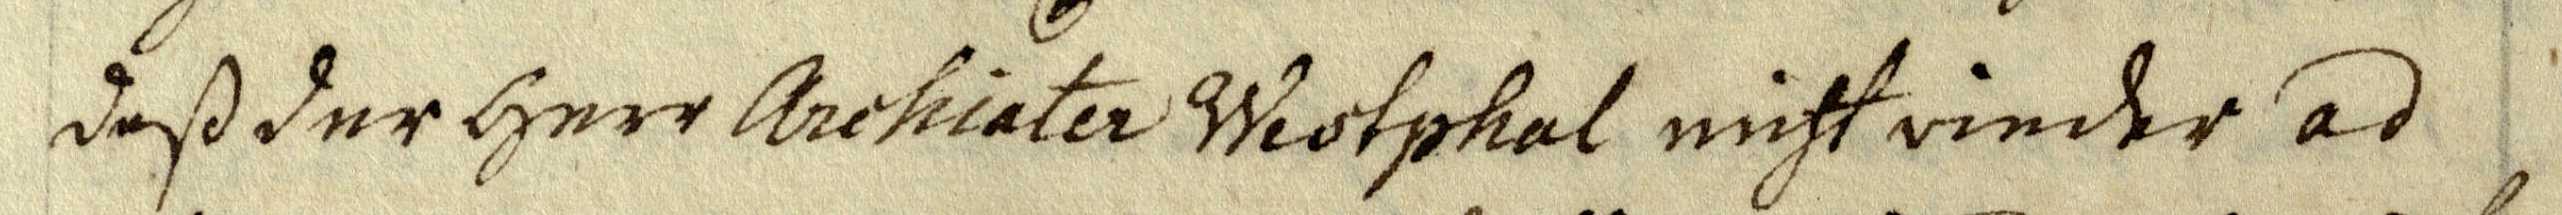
daß der Herr Archiater Westphal nicht wieder ad
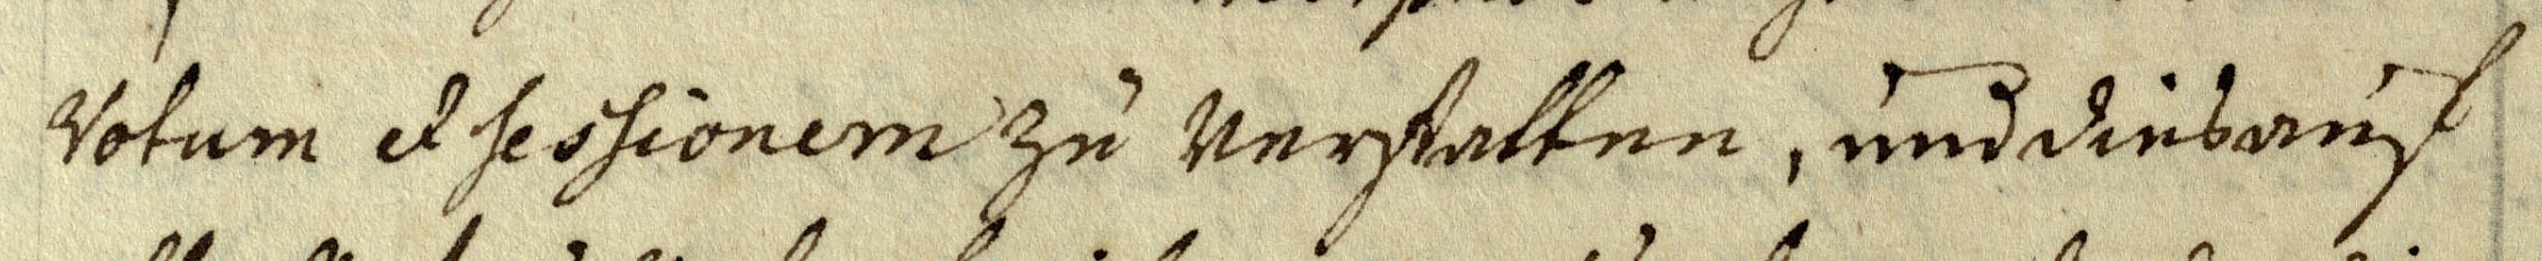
Votum et sessionem zu verstatten, und dies auf
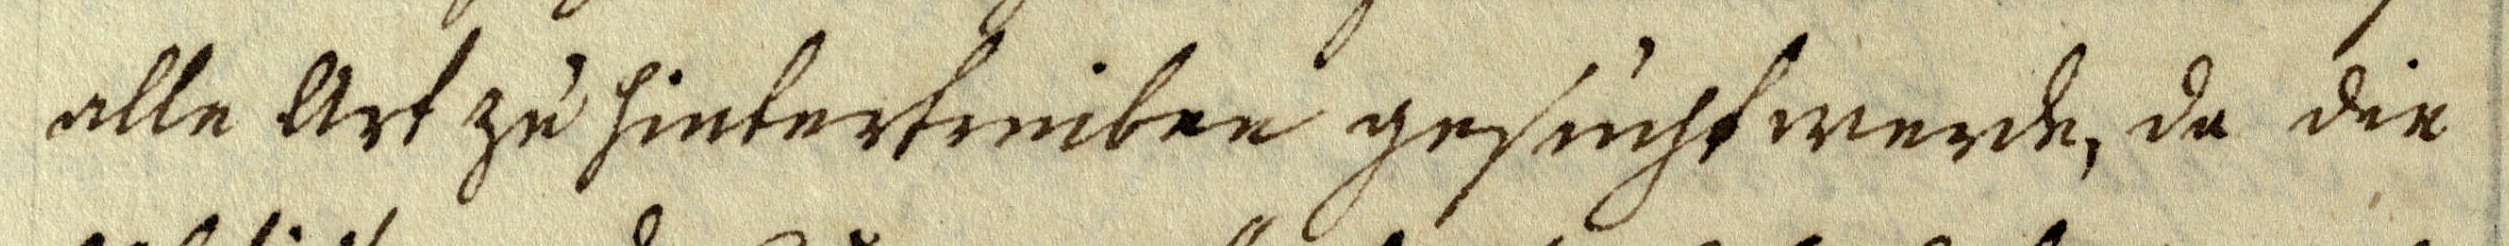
alle Art zu hintertreiben gesucht werde, da die
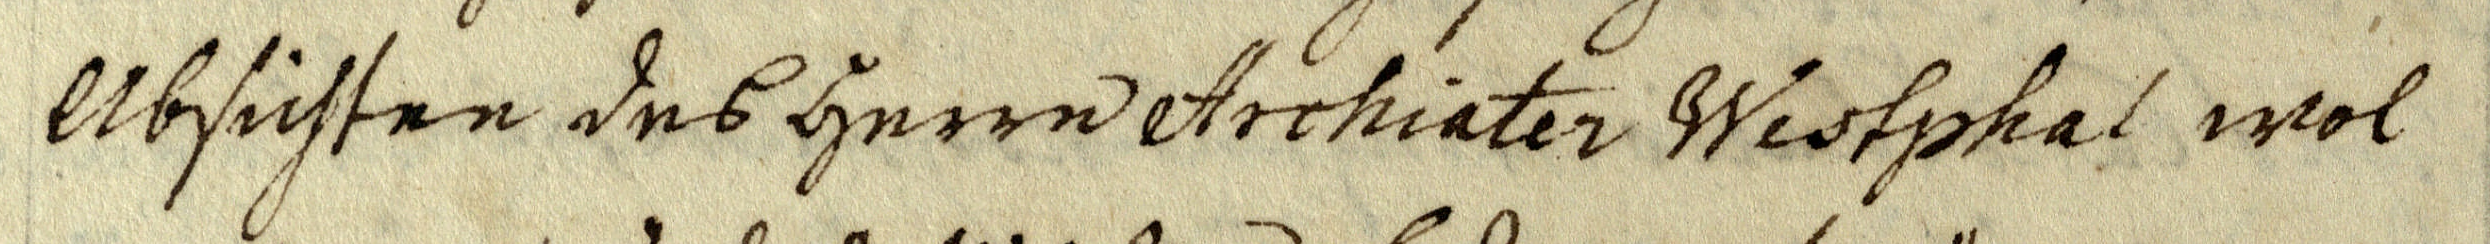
Absichten des Herrn Archiater Westphal wol
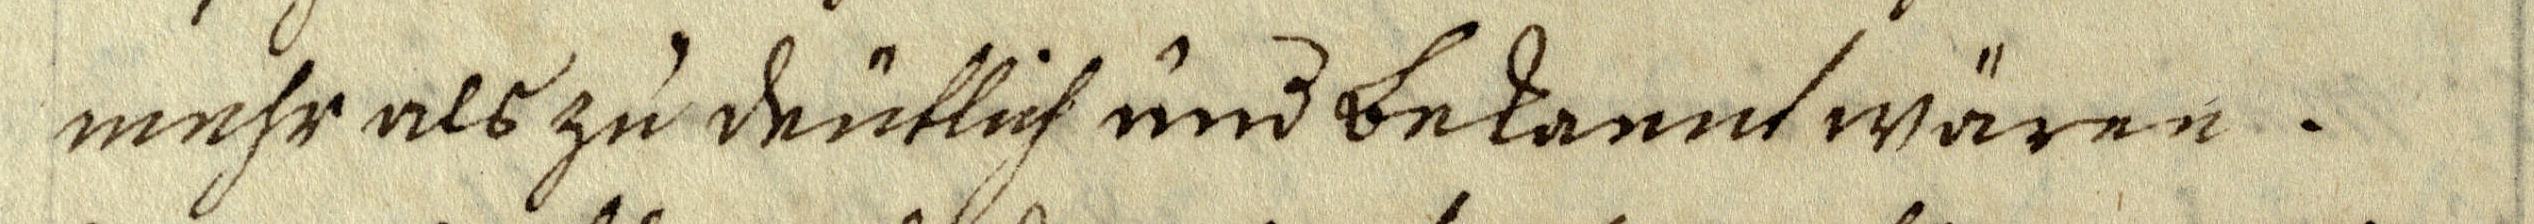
mehr als zu deutlich und bekannt wären.
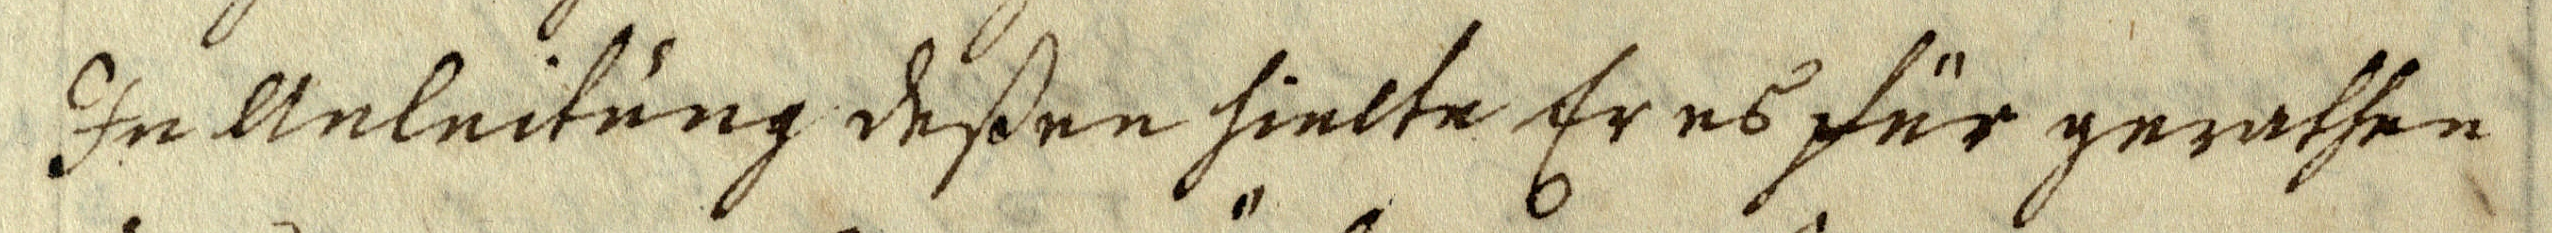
In Anleitung dessen hielte Er es für gerathen
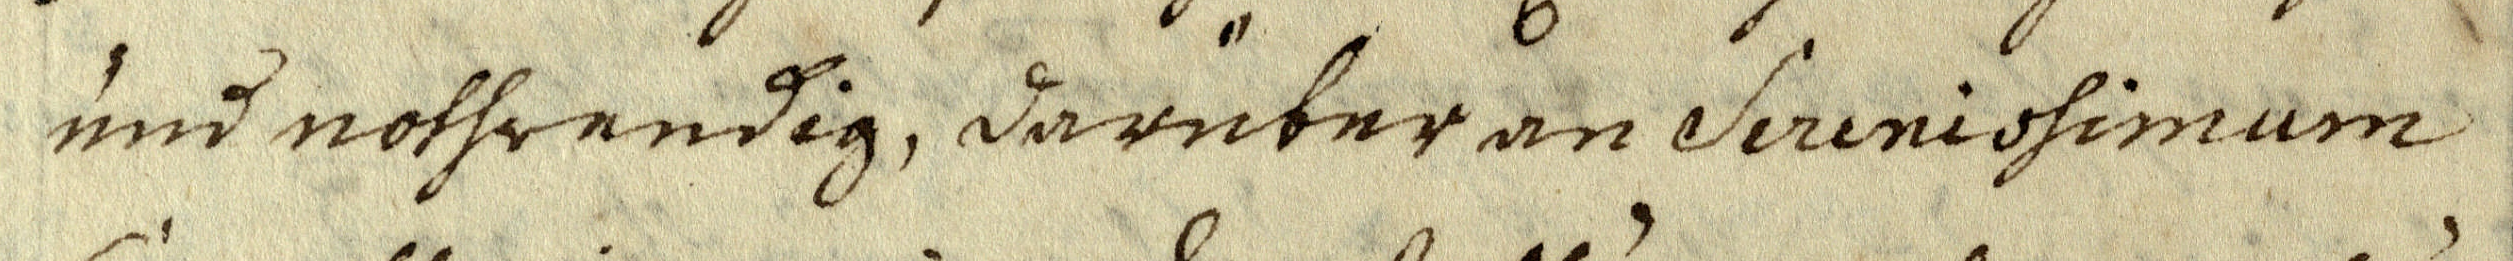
und nothwendig, darüber an Serenissimum
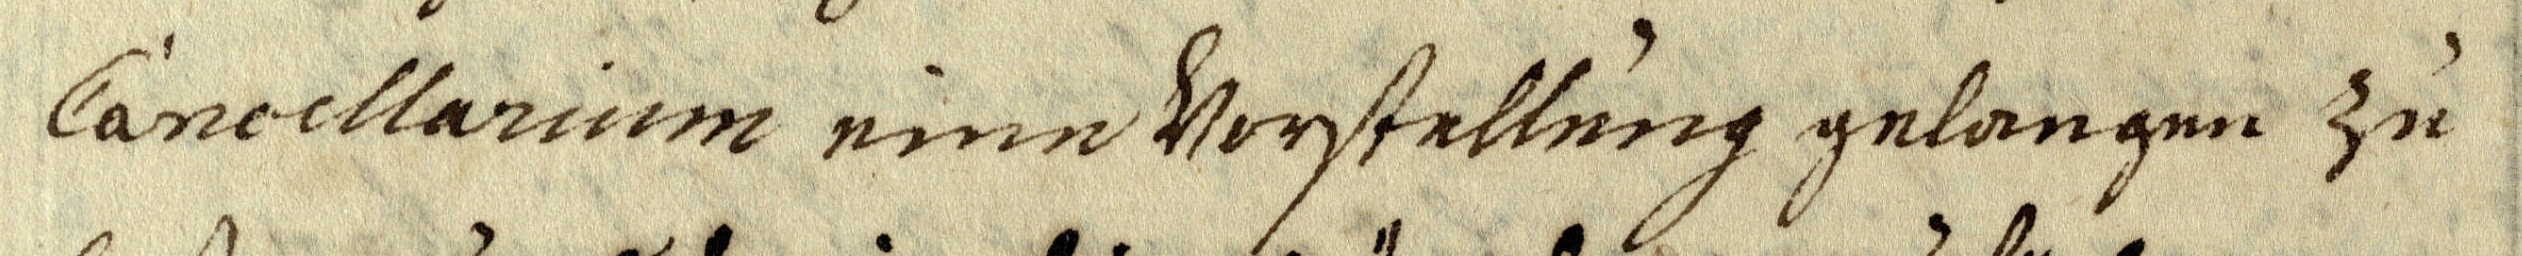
Cancellarium eine Vorstellung gelangen zu
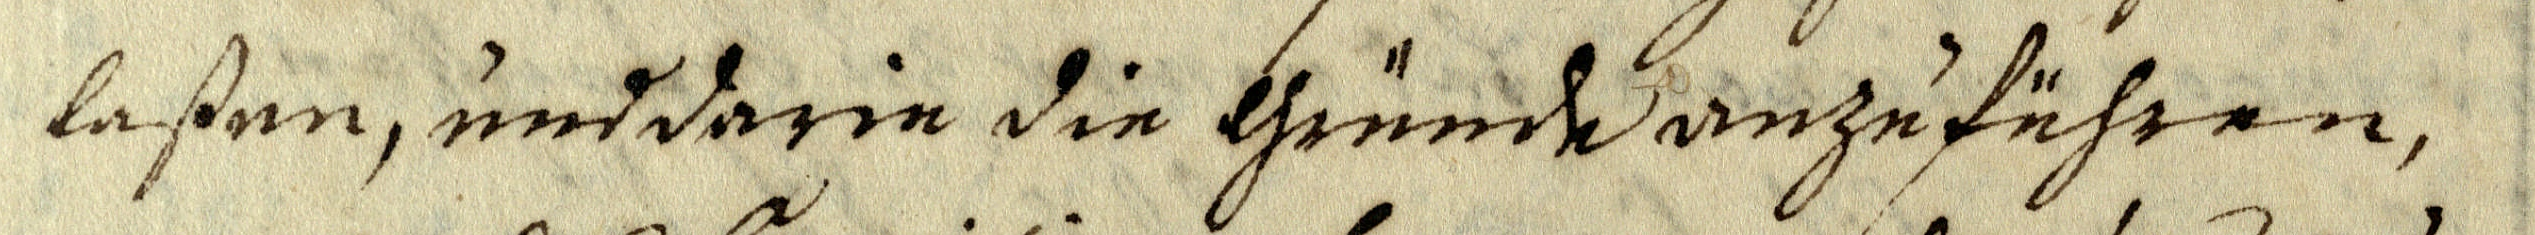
laßen, und darin die Gründe anzuführen,
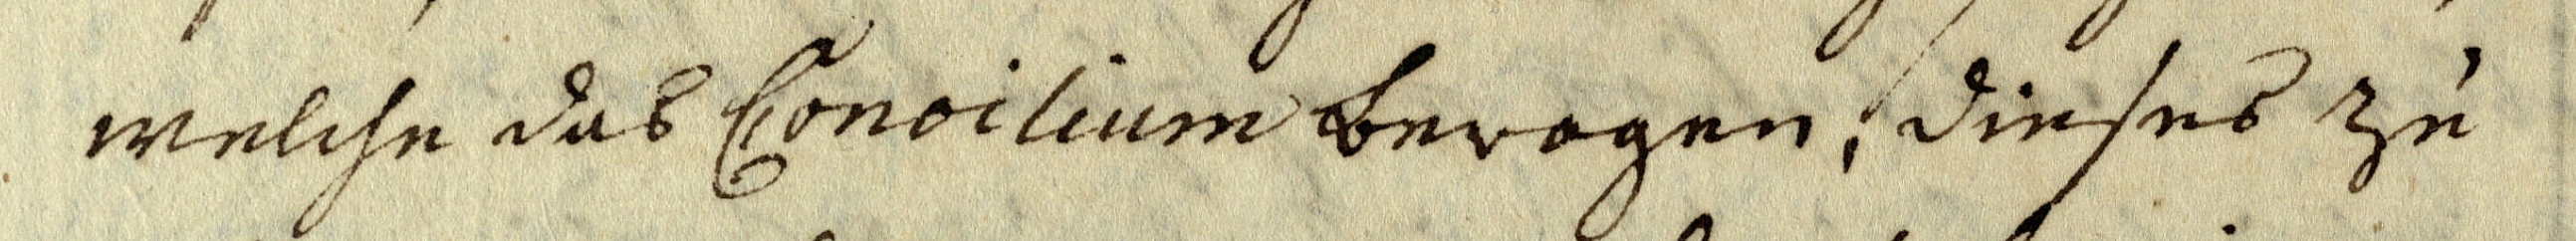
welche das Concilium bewogen; dieses zu
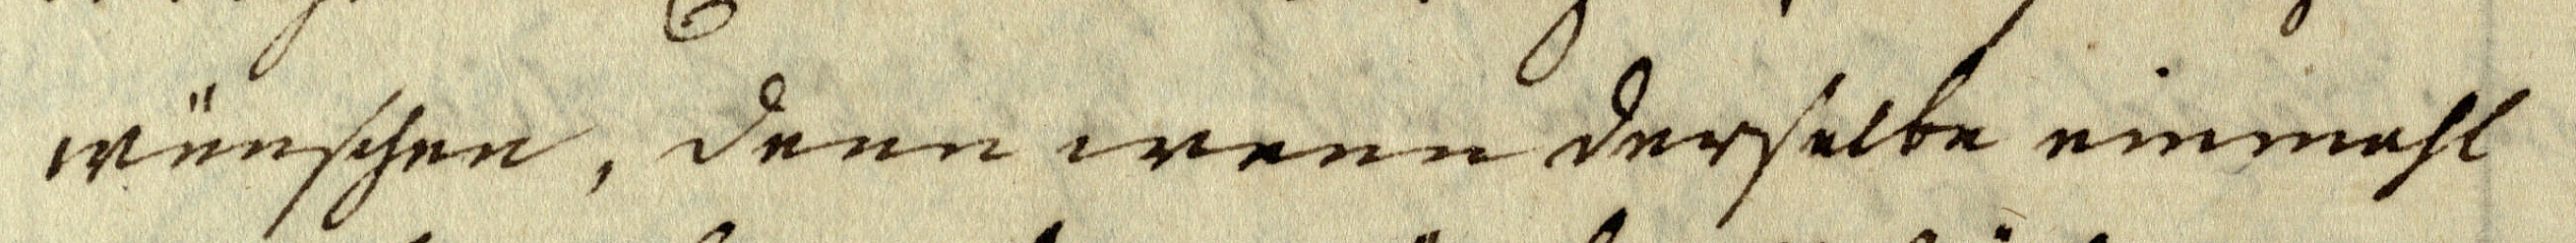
wünschen, denn wenn derselbe einmahl
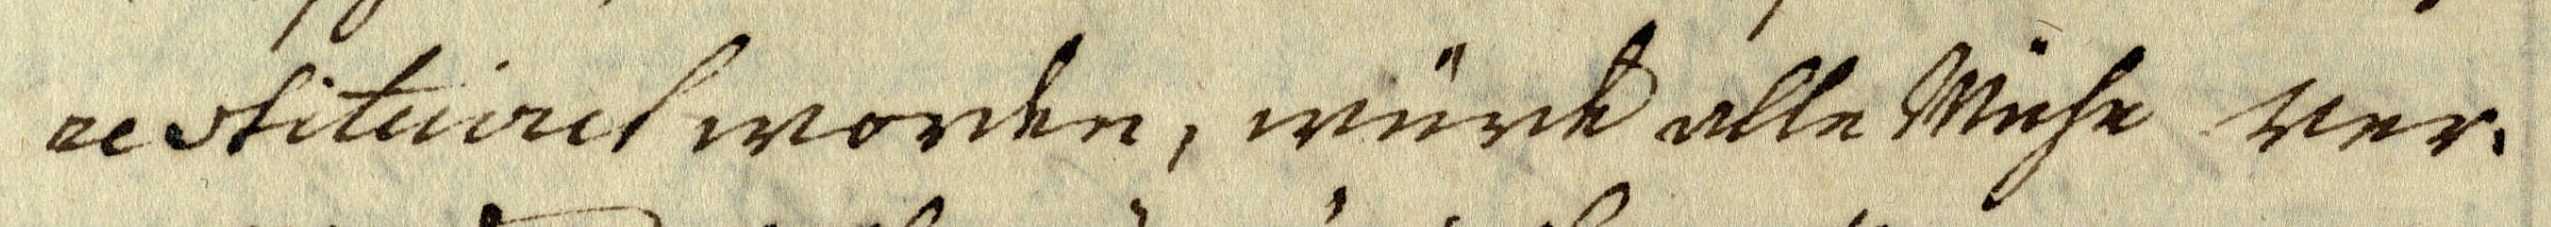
restituiret worden, würde alle Mühe ver¬
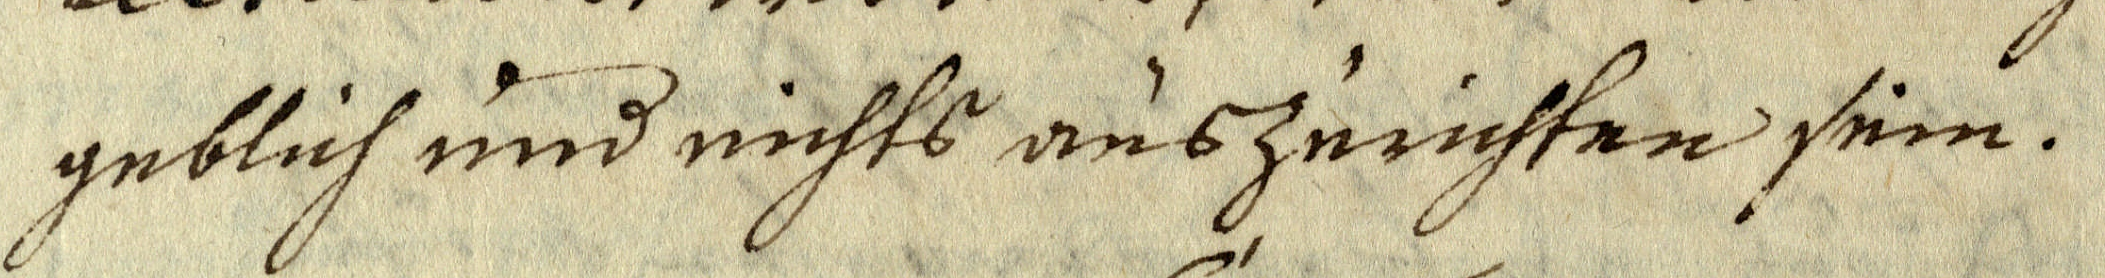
geblich und nichts auszurichten sein.
